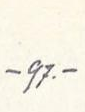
97
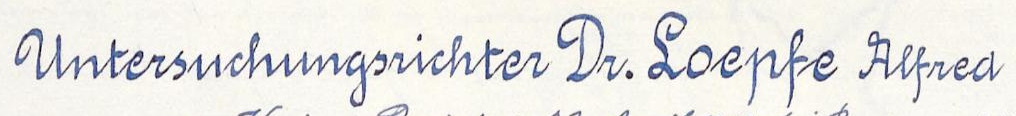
Untersuchungsrichter Dr. Loepfe Alfred
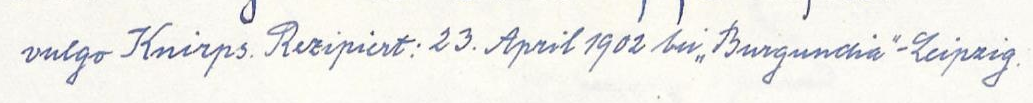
vulgo Knirps Rezipiert. 23. April 1902 bei "Burgundia" Leipzig.
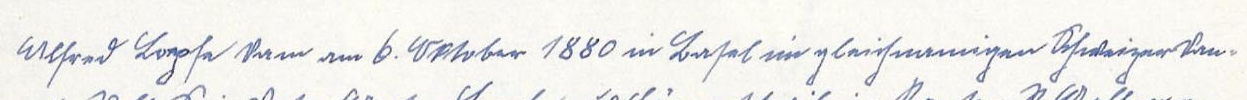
Alfred Loepfe kam am 6. Oktober 1880 in Basel im gleichnamigen Schweizerkan-
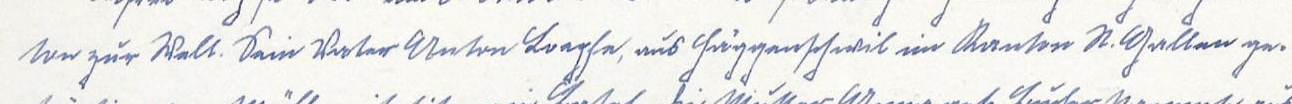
ton zur Welt. Sein Vater Anton Loepfe, aus Fäggenschwil im Kanton St. Gallen ge-
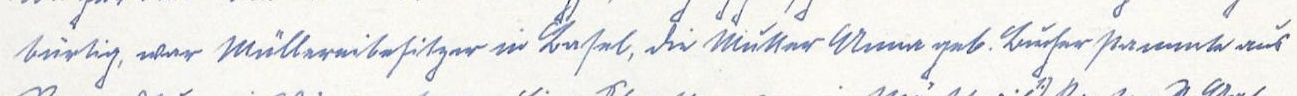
bürtig, war Müllereibesitzer in Basel, die Mutter Anna geb. Bucher stammte aus
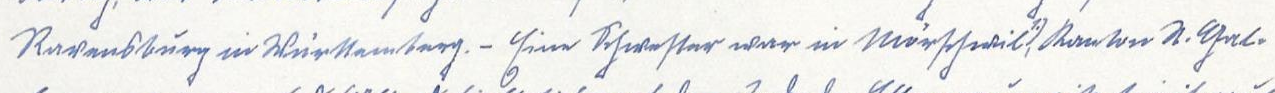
Ravensburg in Württemberg. Die Schwester war in Morschwil 1) Kanton St. Gal-
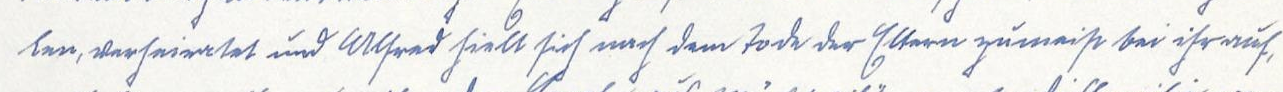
len verheiratet und Alfred hielt sich nach dem Tode der Eltern zumeist bei ihrauf,
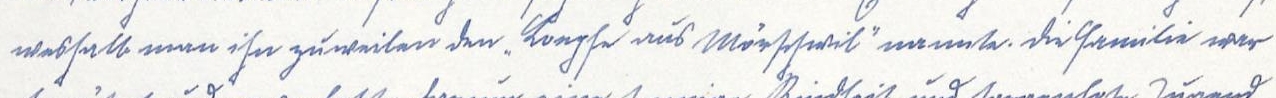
weshalb man ihn zuweilen den „Loepfe aus Mörschwil“ nannte. Die Familie war
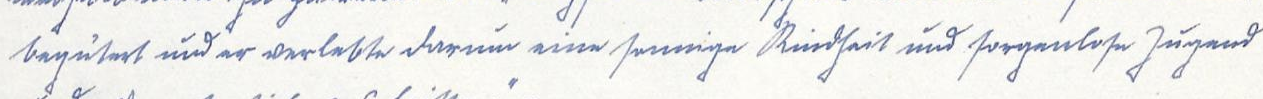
begütert und er verlebte darum eine sonnige Kindheit und sorgenlose Jugend
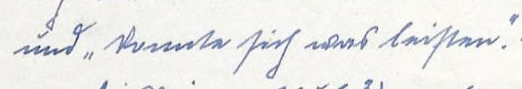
und „konnte sich was leisten
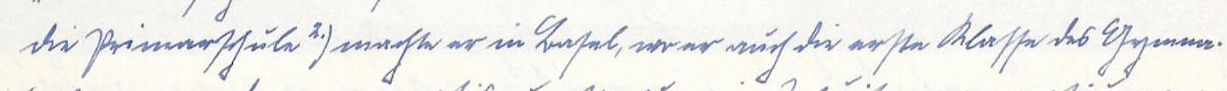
Die Primarschule 2) machte er in Basel, wo er auch die erste Klasse des Gymna-
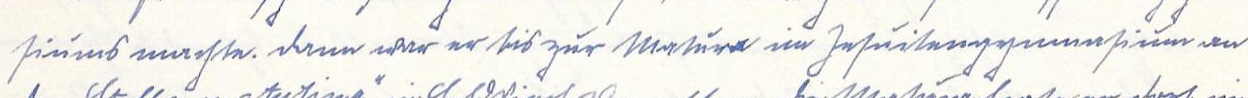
siums machte. Dann war er bis zur Matura im Jesuitengymnasium an
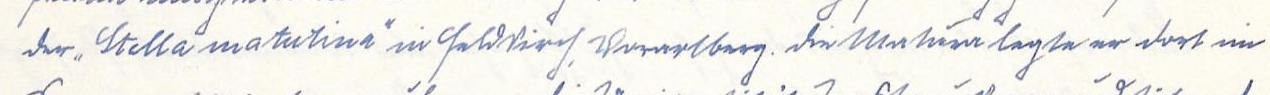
der "Stella matutina“ in Feldkirch Voralberg. Die Matura legte er dort im
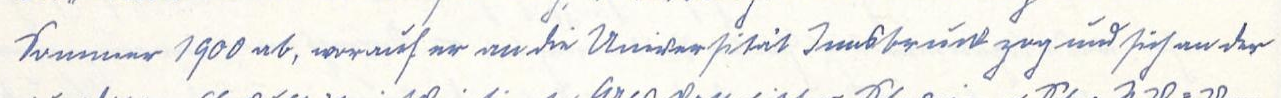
Somnmer 1900 ab, worauf er an die Universität Innsbruck zog und sich an der
